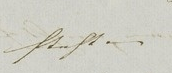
steht. –
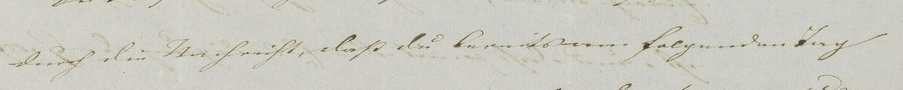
durch die Nachricht, daß Du bereits am folgenden Tag
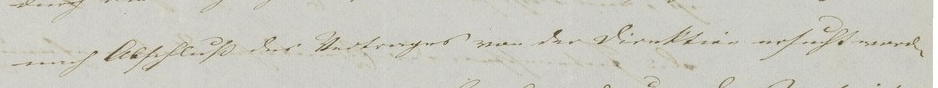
nach Abschluß des Vertrages von der Direktion ersucht worden
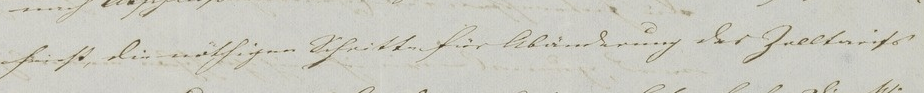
seiest, die nöthigen Schritte für Abänderung des Zolltarifs
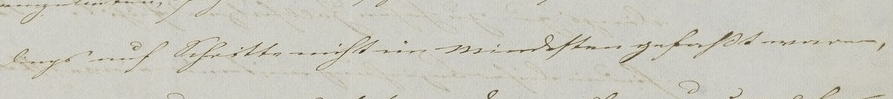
dings auf Schritte nicht im Mindesten gefaßt waren,
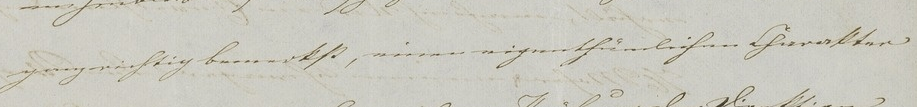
ganz richtig bemerkst, einen eigenthümlichen Charakter
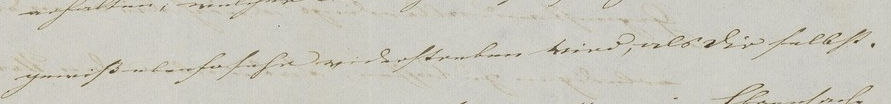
gewiß ebensosehr widerstreben wird, als Dir selbst.
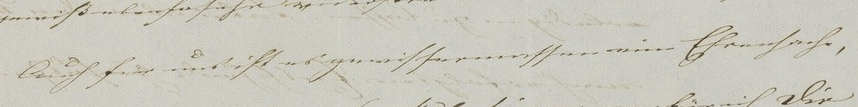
Auch für uns ist es gewissermassen eine Ehrensache,
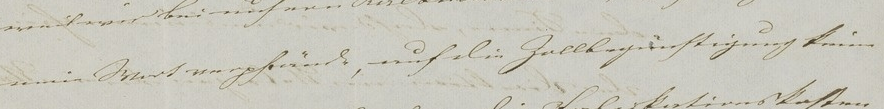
mein Wort verpfände, auf die Zollbegünstigung keine
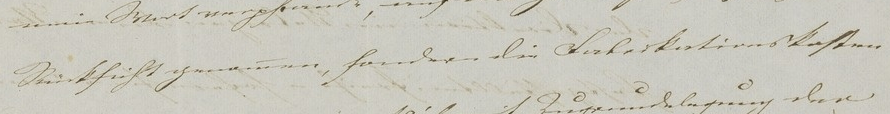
Rücksicht genommen, sondern die Fabrikationskosten
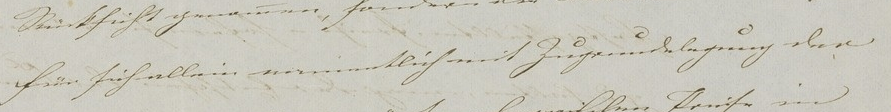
für sich allein namentlich mit Zugrundelegung der
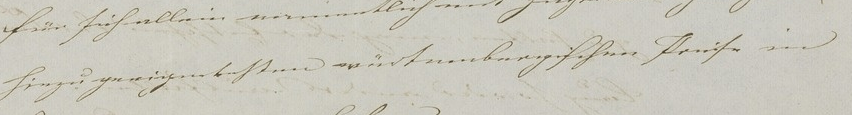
hiezu geeignetesten würtembergischen Preise in
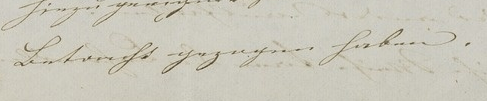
Betracht gezogen haben.
